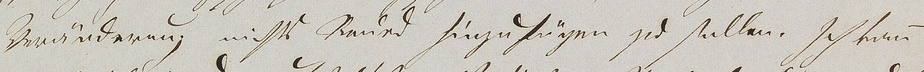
Veränderung nichts Neues hinzufügen zu sollen. Ich kann
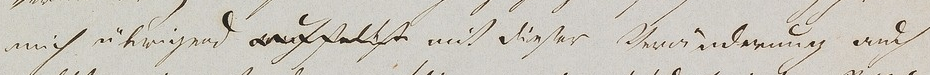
mich übrigens auch selbst mit dieser Veränderung auch
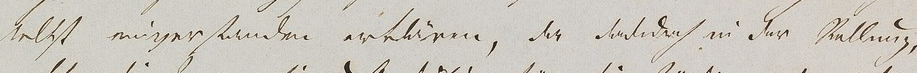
selbst einverstanden erklären, da dadurch in der Stellung,
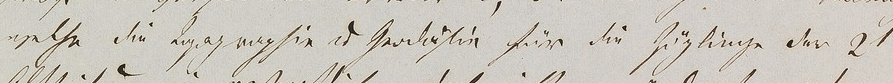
welche die Topographie u Geodäsie für die Zöglinge der 2t
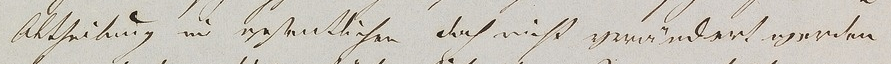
Abtheilung im wesentlichen doch nicht verändert werden
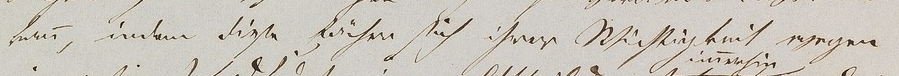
kann, indem diese Fächer sich ihrer Wichtigkeit wegen
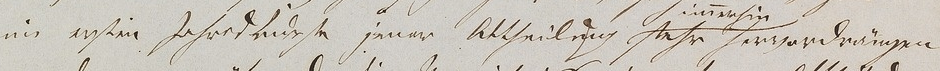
im ersten Jahreskurse jener Abtheilung immerhin sehr hervordrängen
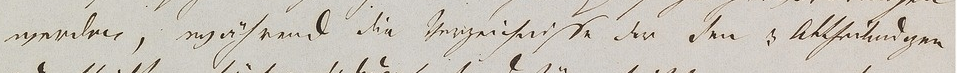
werden, während die Verzeichnisse der den 3 Abtheilungen
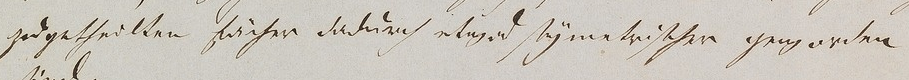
zugetheilten Fächer dadurch etwas symetrischer geworden
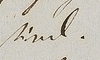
sind.
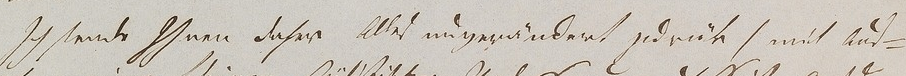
Ich sende Ihnen daher Alles unverändert zurük mit Aus-
